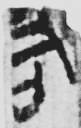青（情）
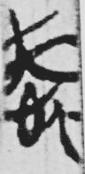○（愛）
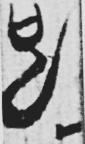也
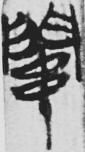○（關）
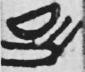疋（雎）
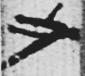之
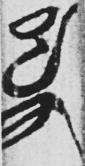改
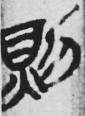則（則）
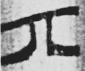亓（其）
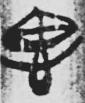思
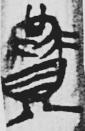賹（益）
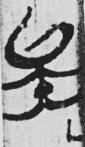矣
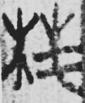梂（樛）
